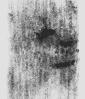十三
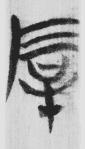厚
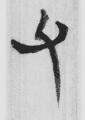父
